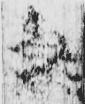十月
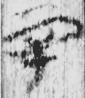辛
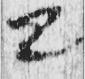巳
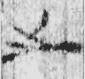之
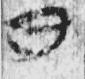日
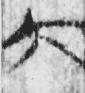大
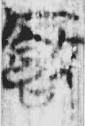○（厩）
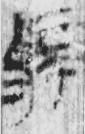馭（御）
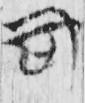司
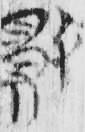敗
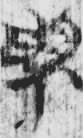受
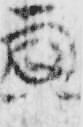○（期）
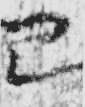己
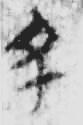丑
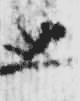之
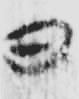日
